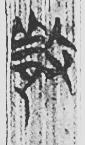敬
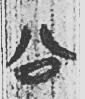公
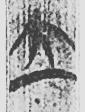立
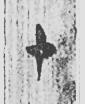十
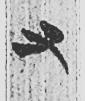又
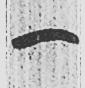一
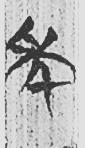年
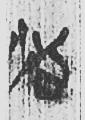{少勺}
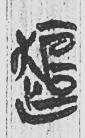𧻚
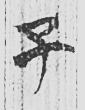子
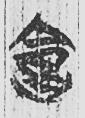會
